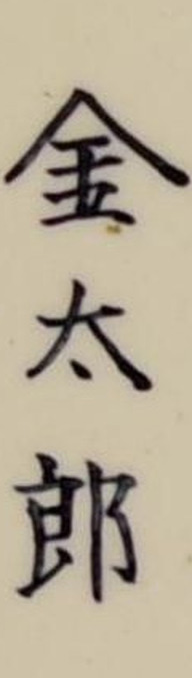金太郎
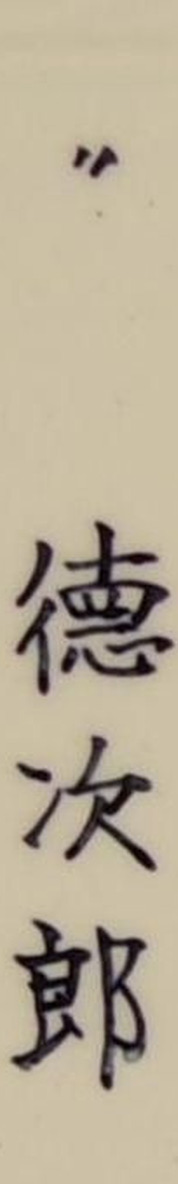徳次郎
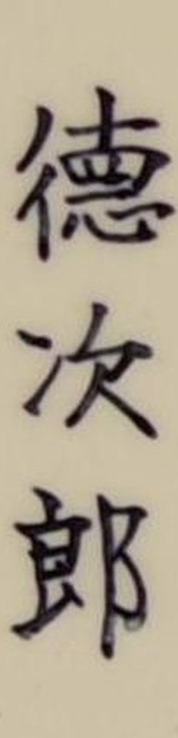徳次郎
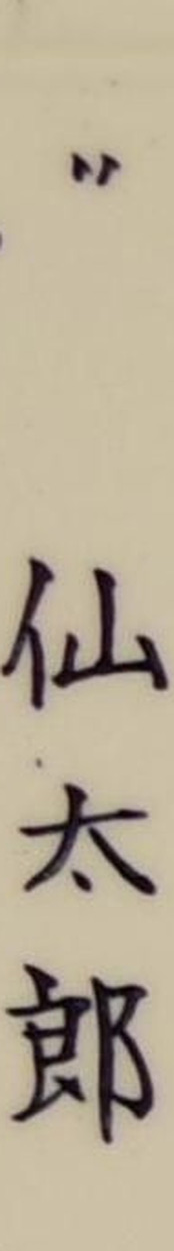仙太郎
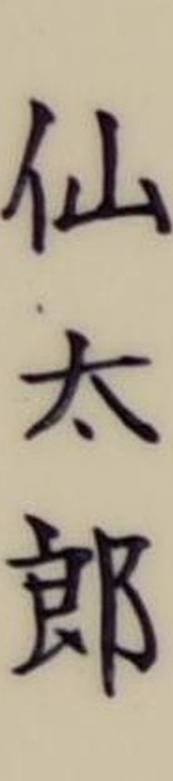仙太郎
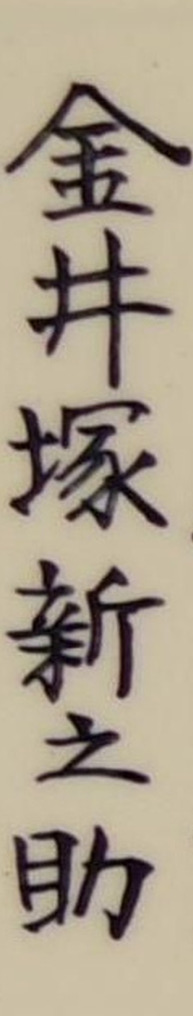金井塚新之助
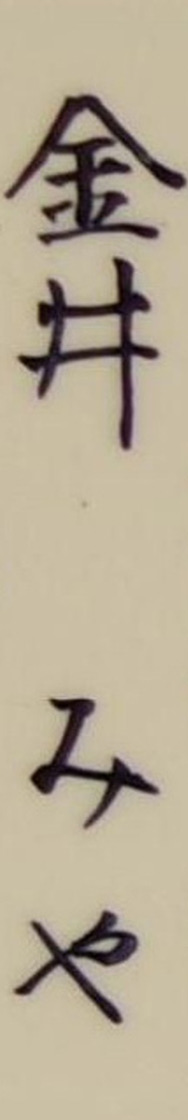金井みや
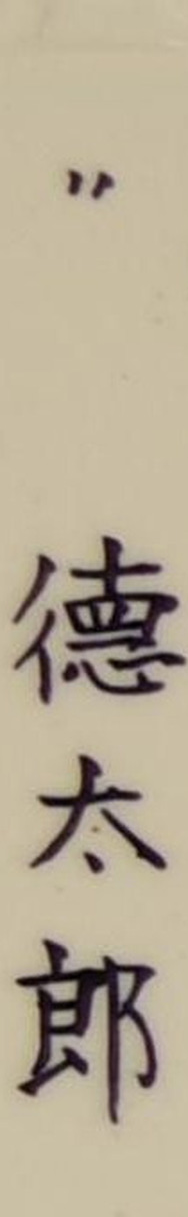徳太郎
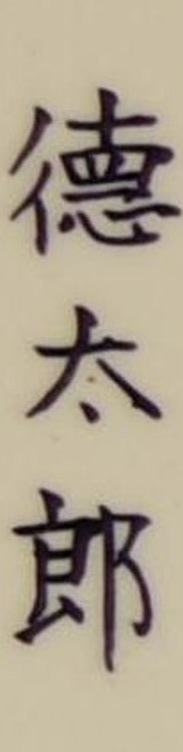徳太郎
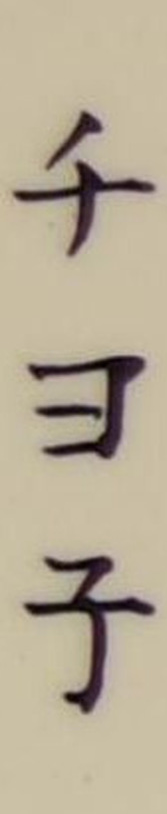チヨ子
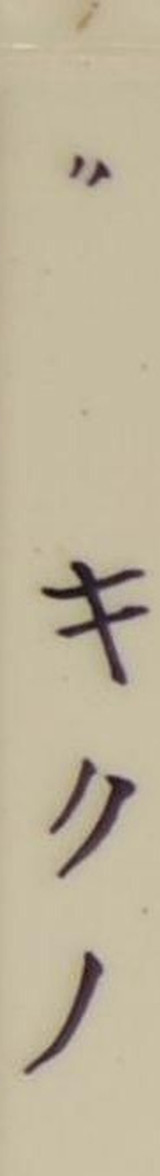キクノ
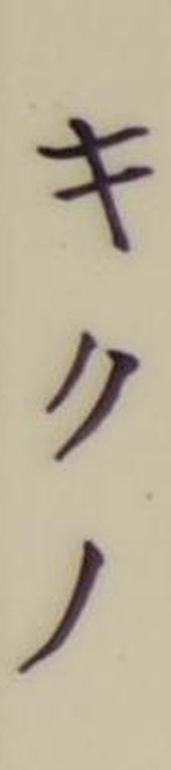キクノ

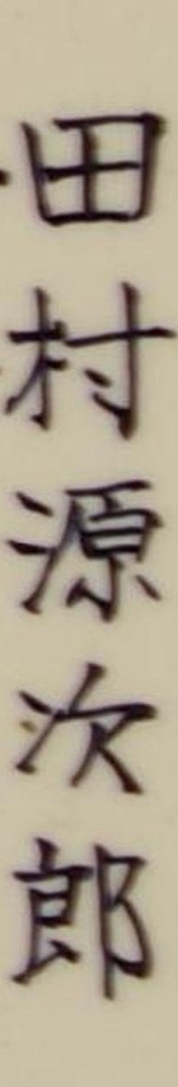田村源次郎
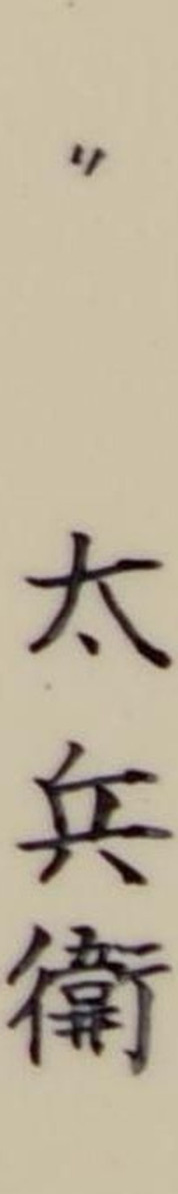太兵衛
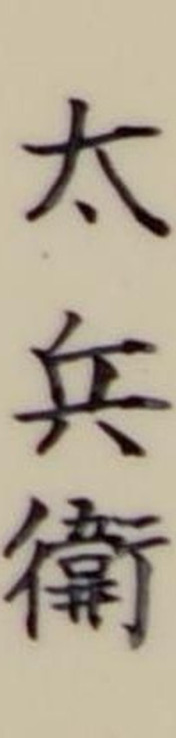太兵衛
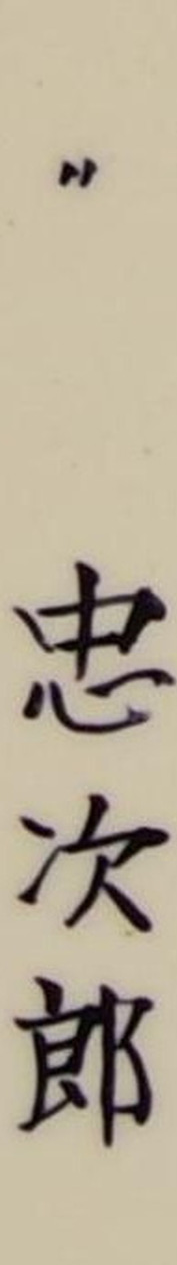忠次郎
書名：A~D
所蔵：koyasan kongobuji
